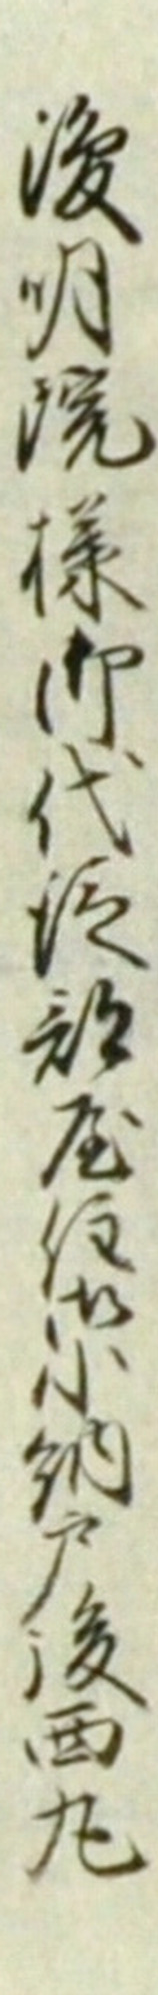浚明院様御代従部屋住御小納戸後西丸
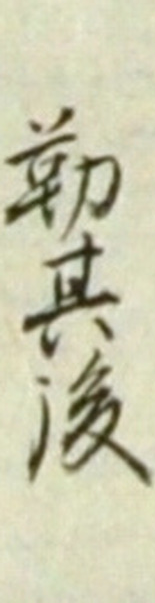勤其後
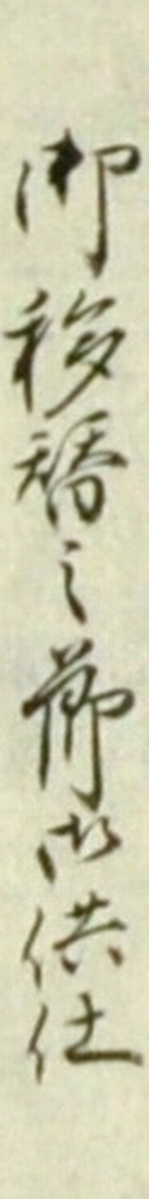御移替之節御供仕
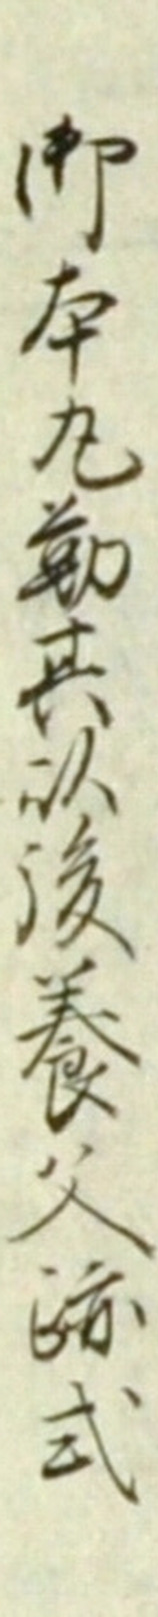御本丸勤共以後養父跡式
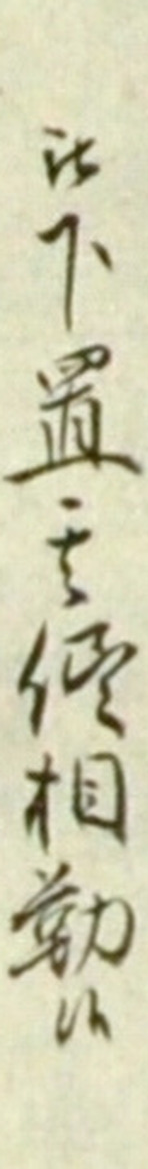被下置其侭相勤候
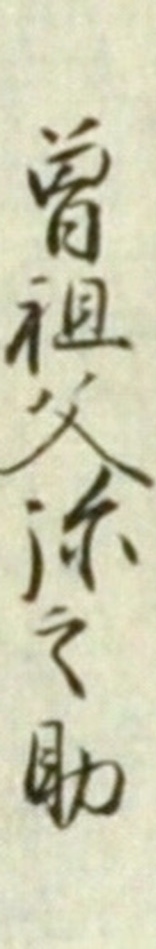曽祖父弥之助
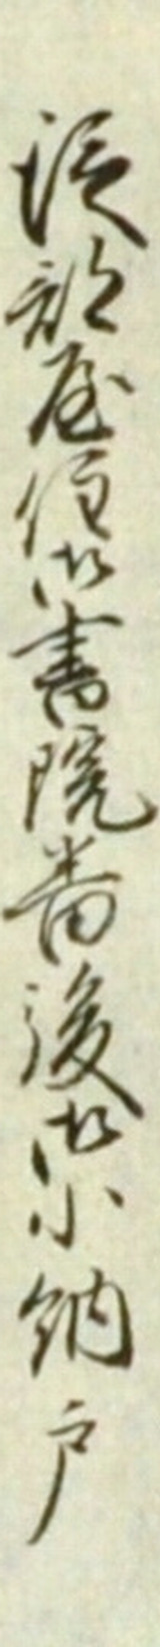従部屋住御書院番後御小納戸
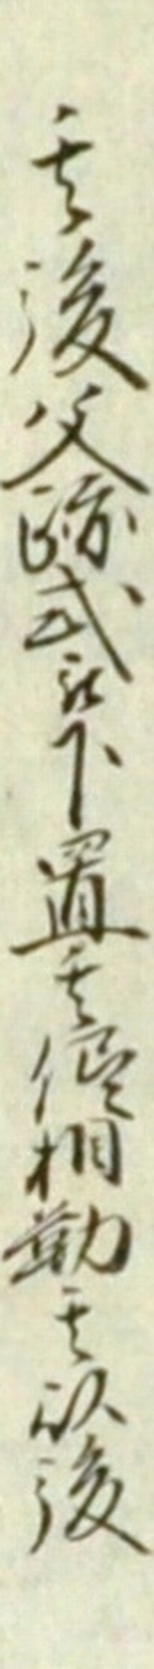其後父跡式被下置其侭相勤其以後
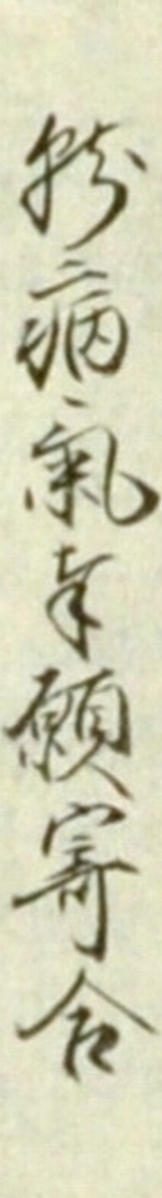就病気奉願寄合
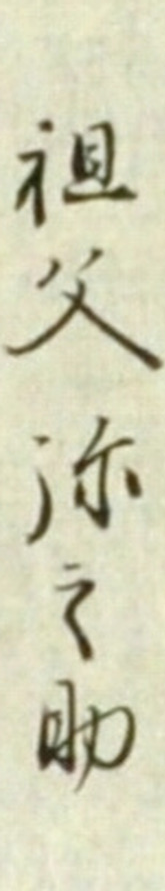祖父弥之助
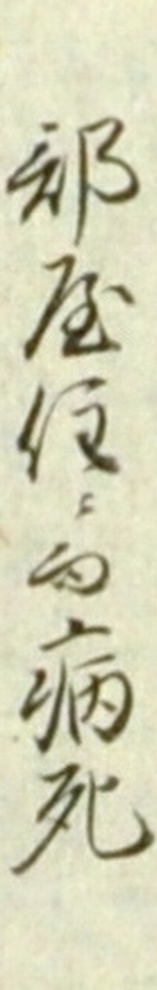部屋住ニ而病死
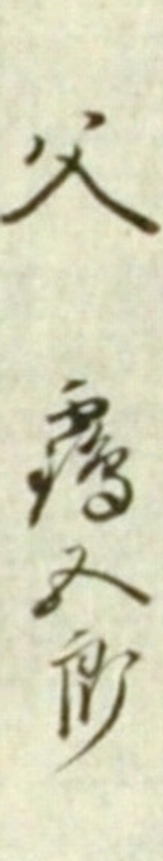父靎五郎
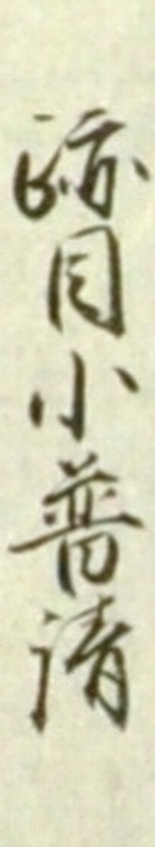跡目小普請
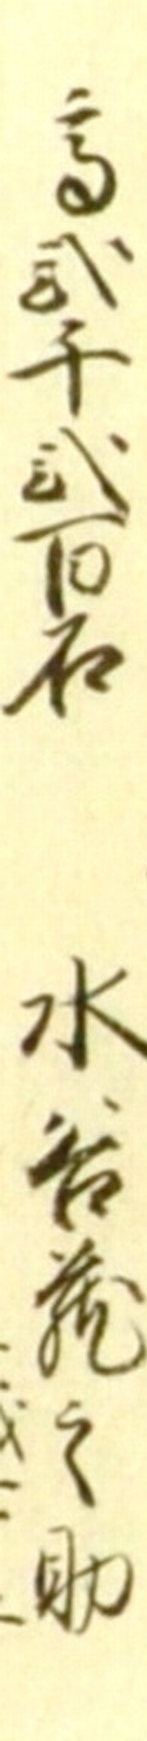高弐千弐百石水谷蔵之助
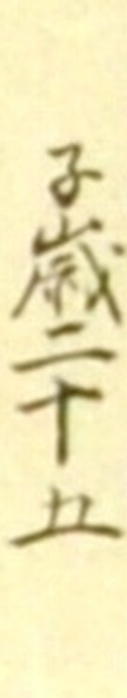子歳二十五
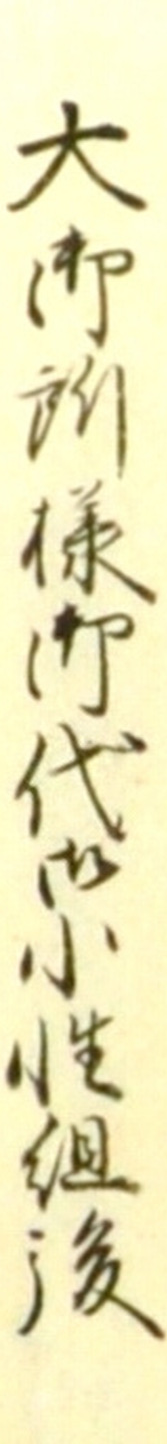大御所様御代御小姓組後
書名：若年寄御役中御調書付
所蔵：伊那市立高遠町図書館・合同会社AMANE
